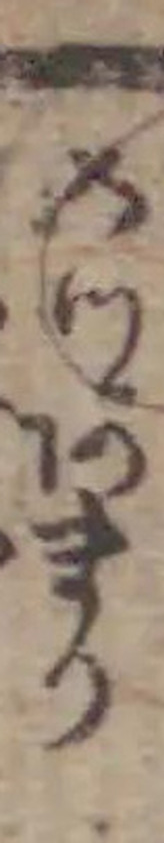五つあまり

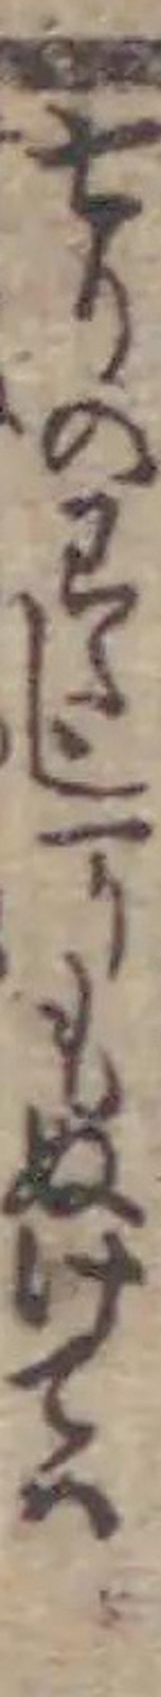七りのわたし一りもぬけては
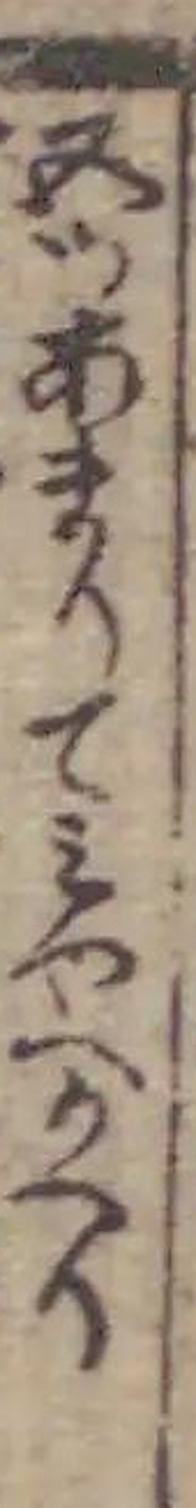五ツあまりてみやへかへり
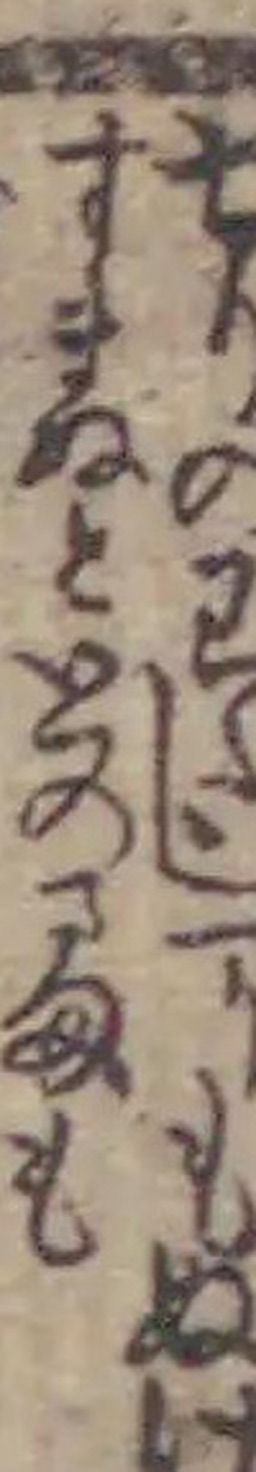すまぬととのさまも
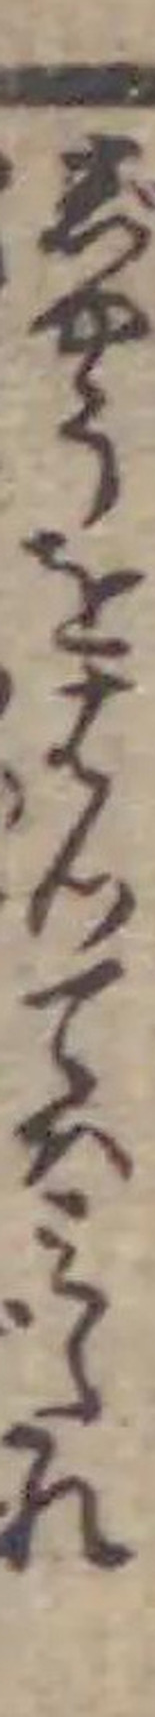じやうをはつてはみたれ
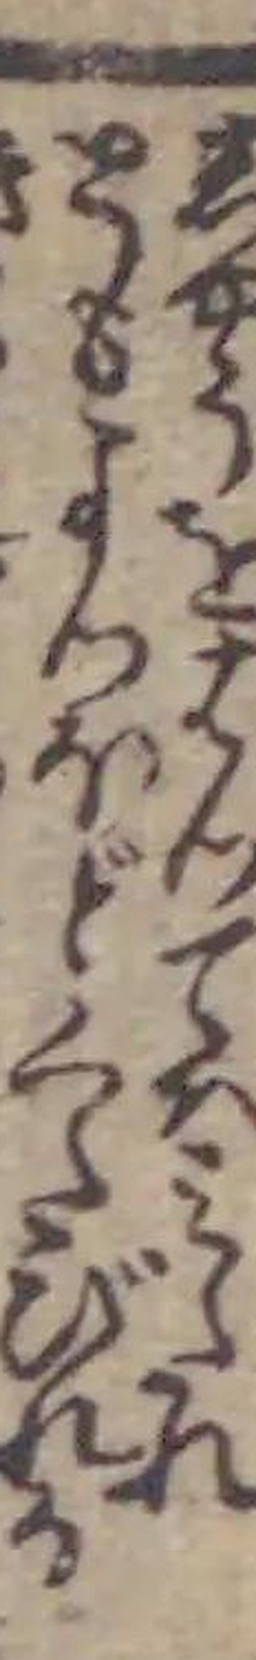ともよつほどくたびれか
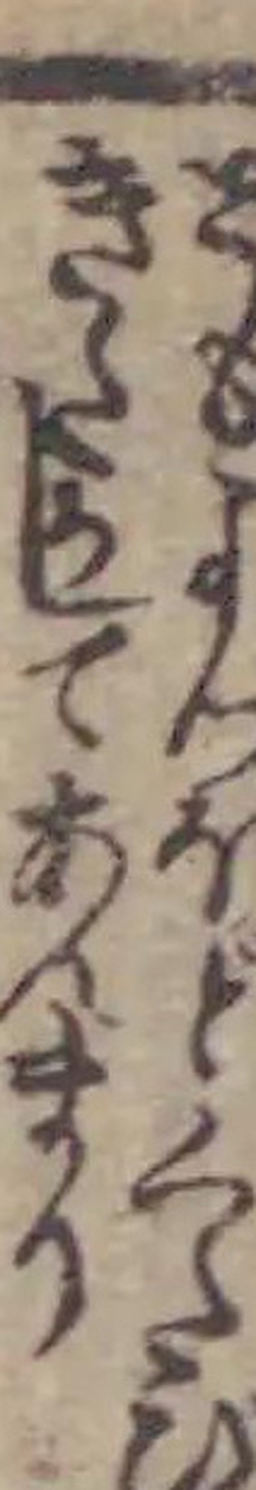きたかしてあんまり
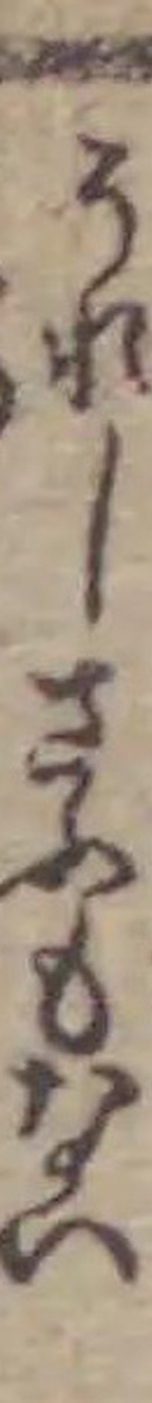うれしさふもない
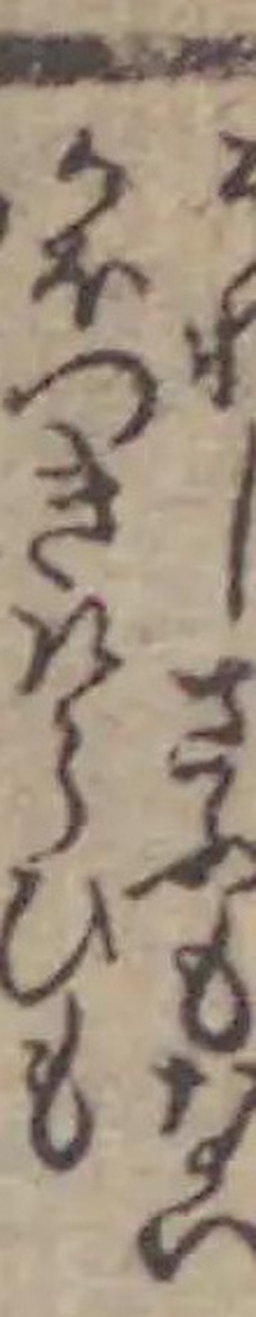かほつきけらひも
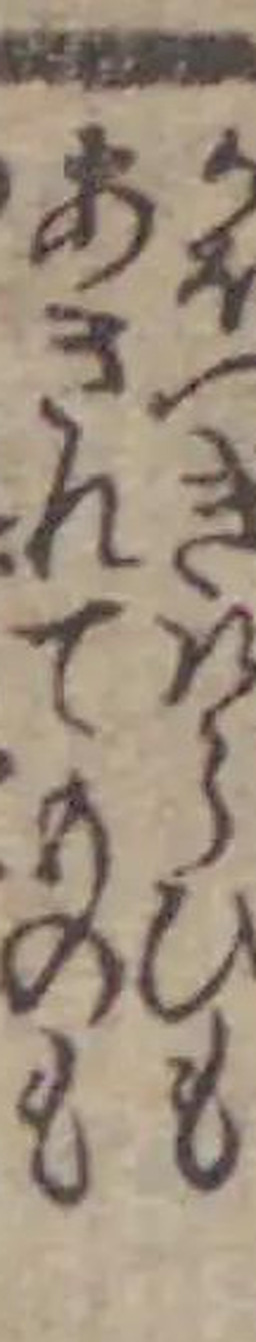あきれてものも
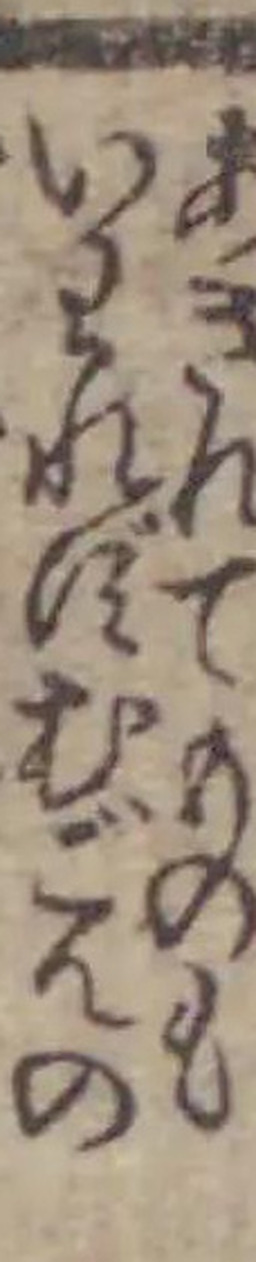いわれずむごんの
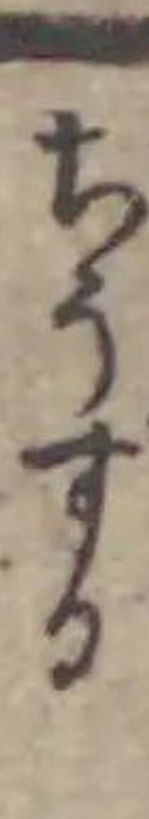ちうする
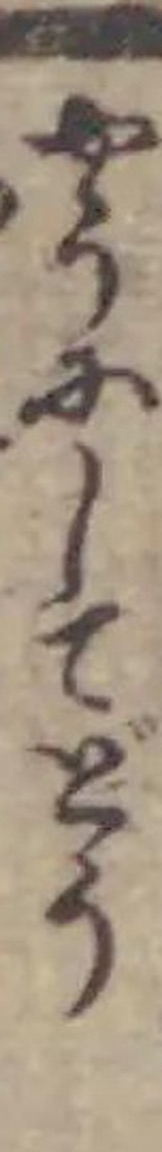やうにしてど
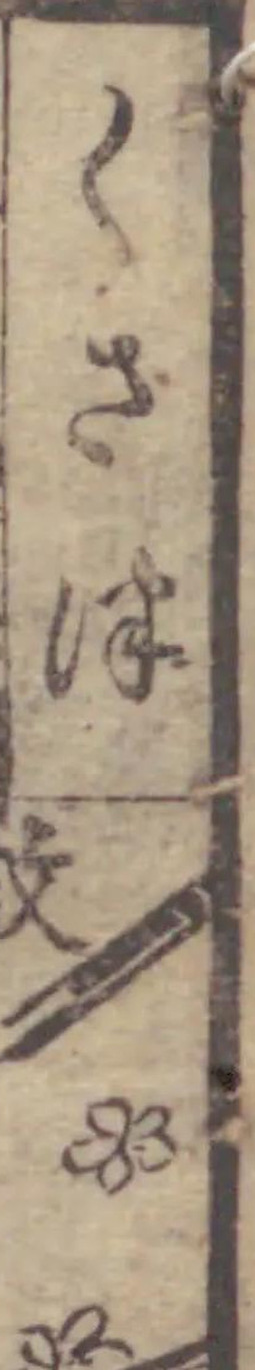くさつ
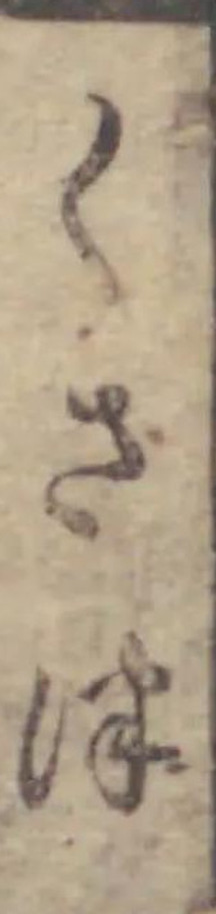くさつ
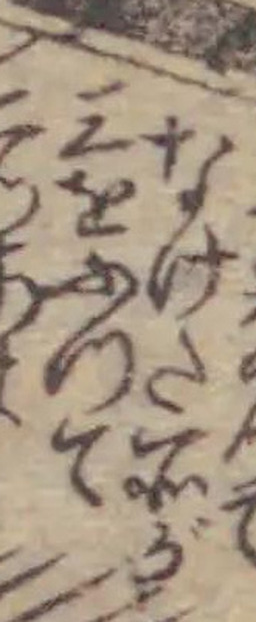三をふつて
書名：道笑双六
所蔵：国立国会図書館 National Diet Library, JAPAN
